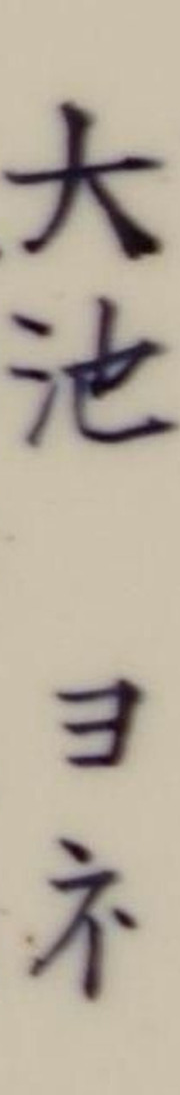大池ヨネ
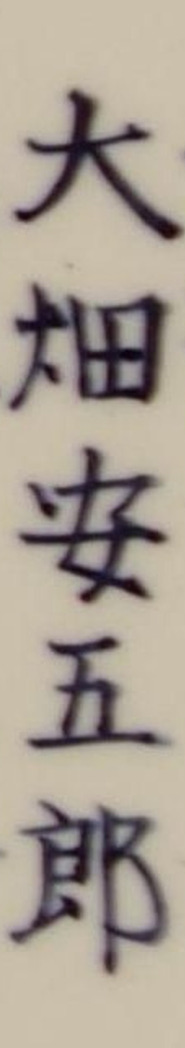大畑安五郎
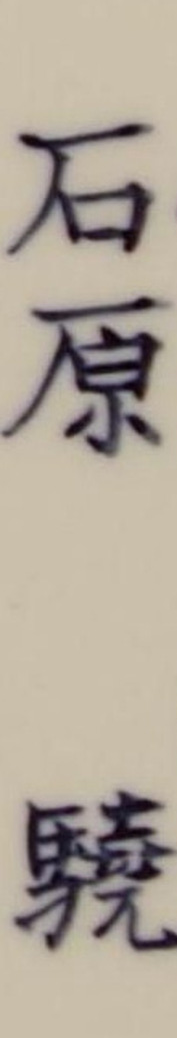石原驍
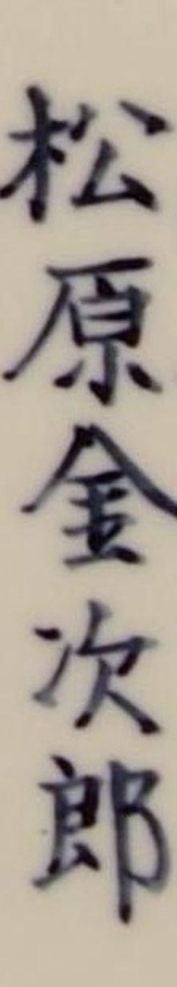松原金次郎
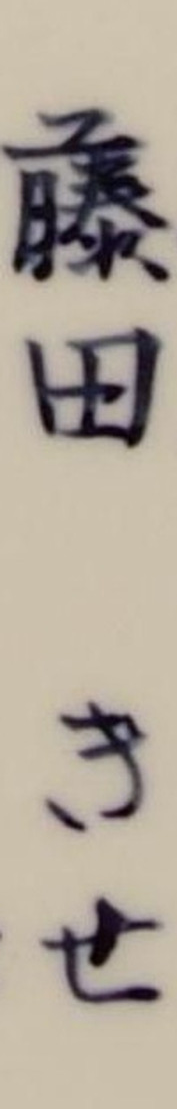藤田きせ
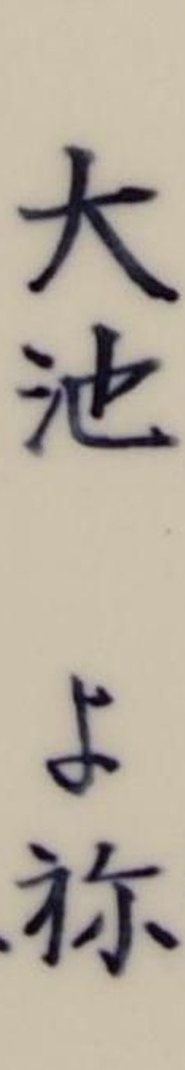大池よね
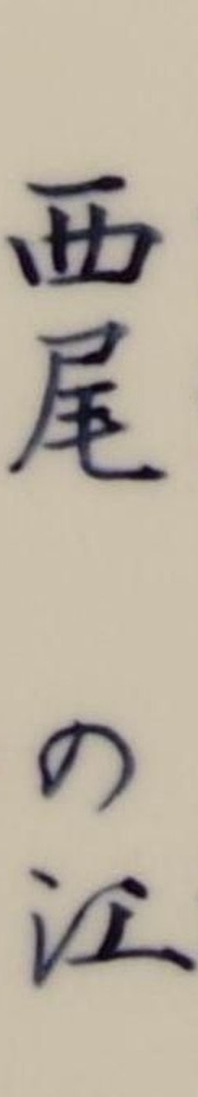西尾の江
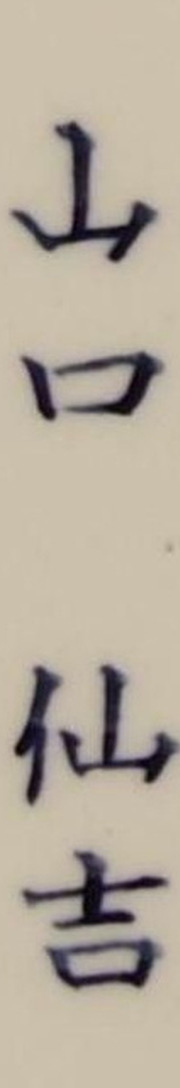山口仙吉
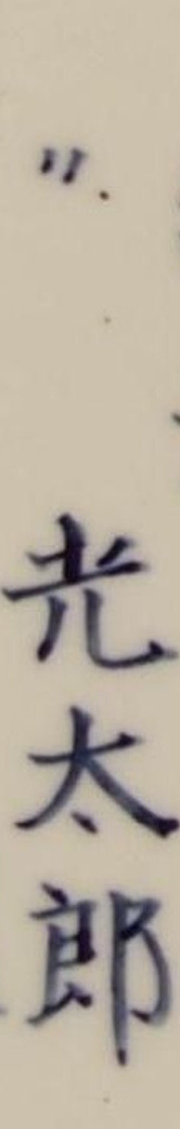光太郎
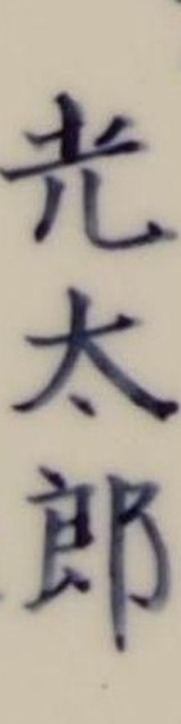光太郎
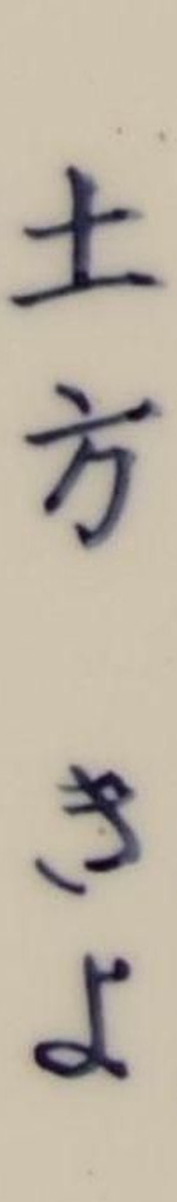土方きよ
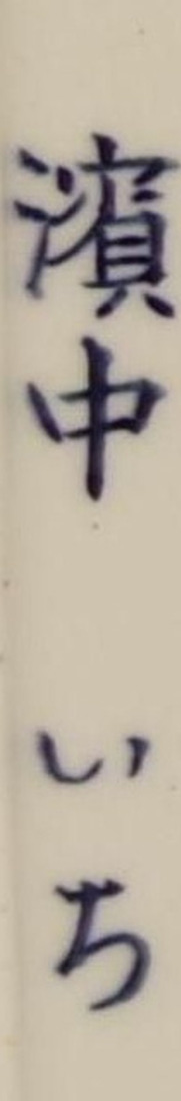濱中いち

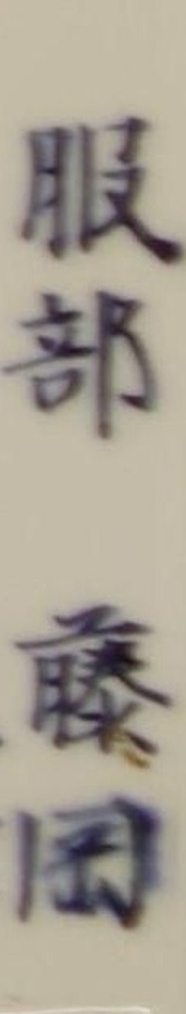服部藤岡
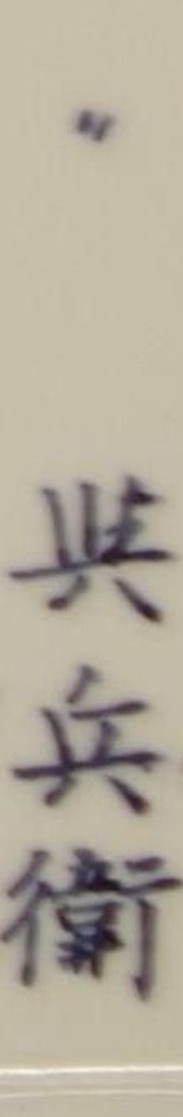与兵衛
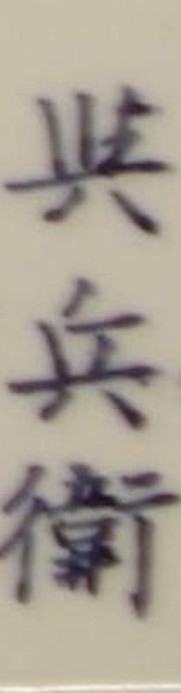与兵衛
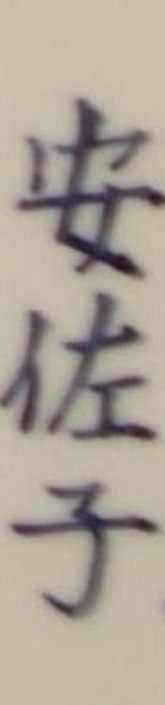安佐子
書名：M~S
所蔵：高野山金剛峯寺
